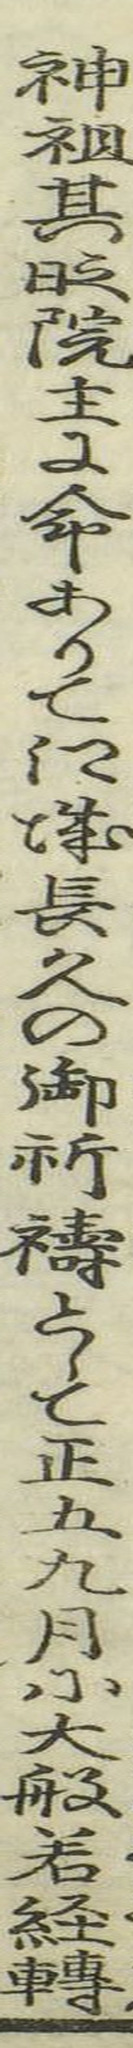神祖其時院主に命ありて江城長久の御祈禱として正五九月に大般若経転

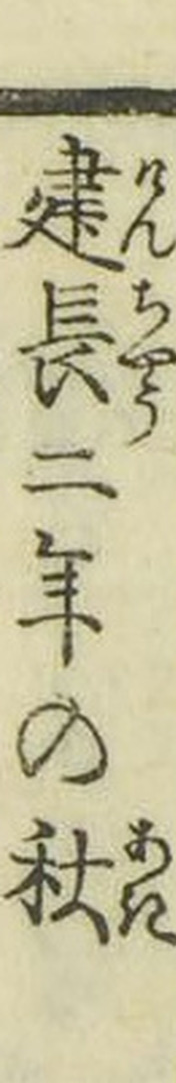建長二年の秋
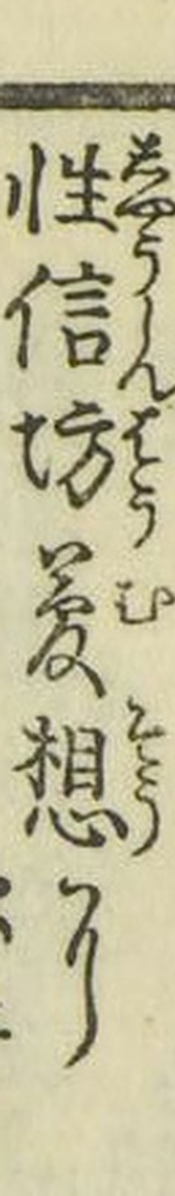性信坊夢想に
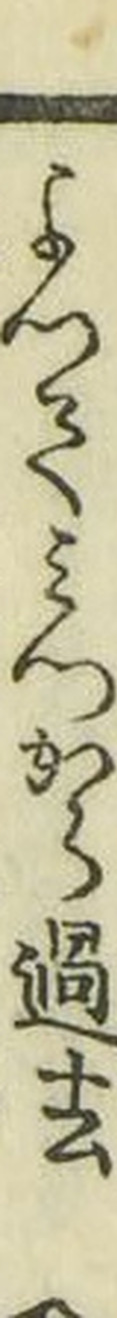よつてみつから過去
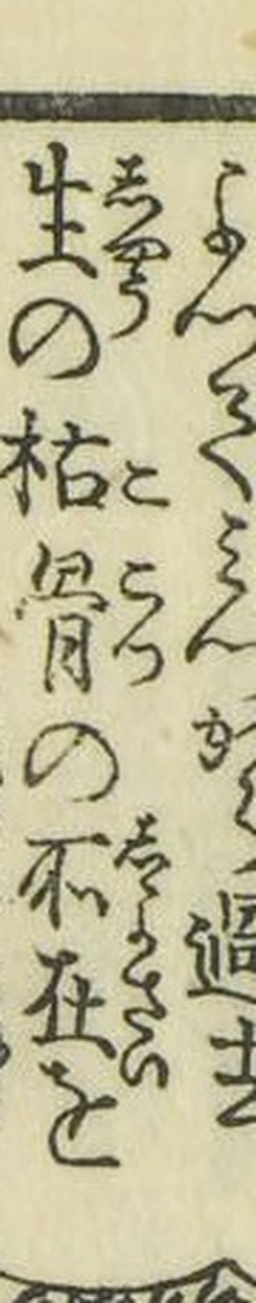生の枯骨の所在を
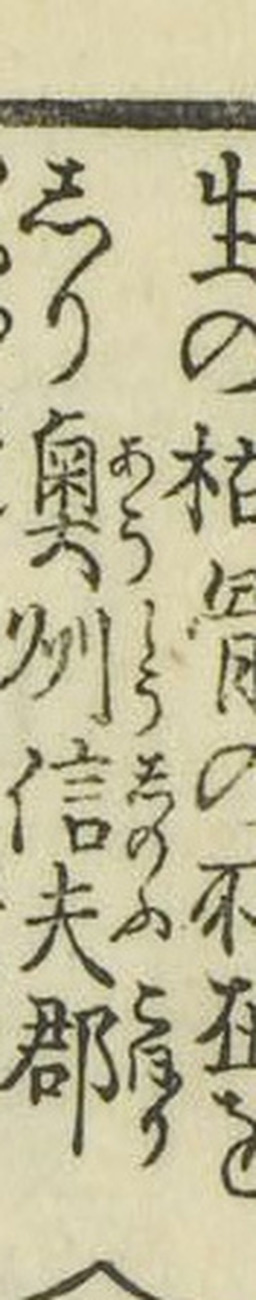しり奥州信夫郡
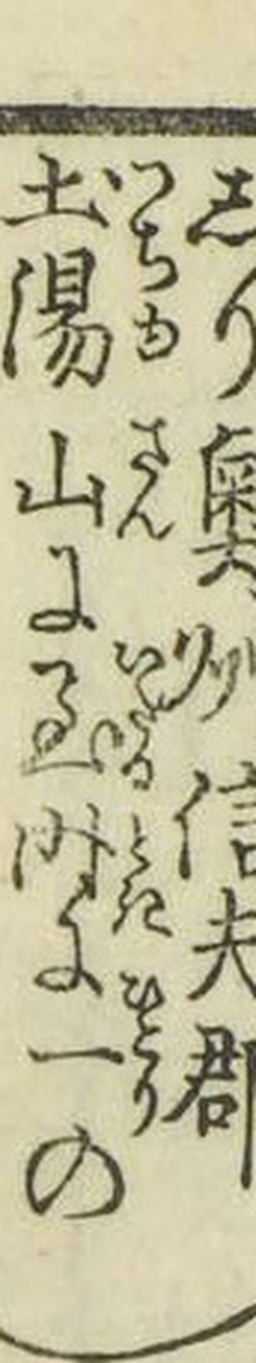土湯山に至時に一の
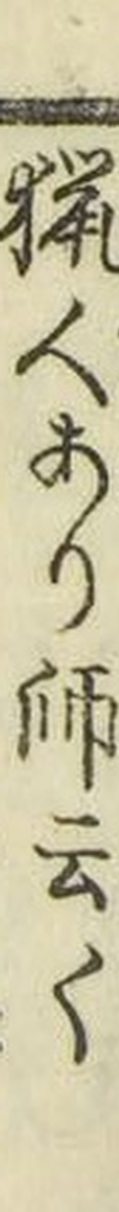猟人あり師云く
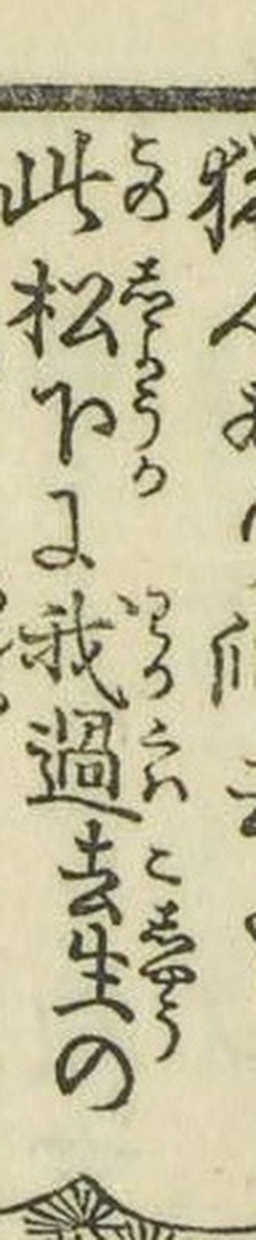此松下に我過去生の
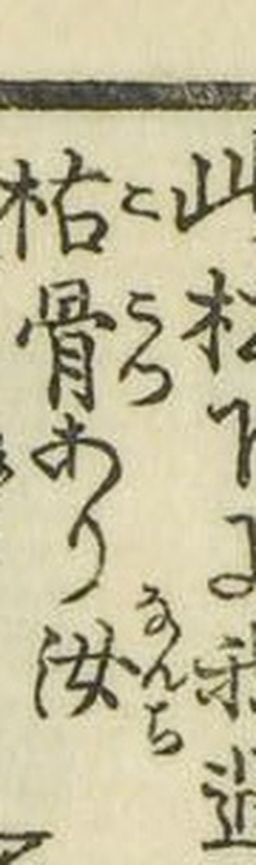枯骨あり汝
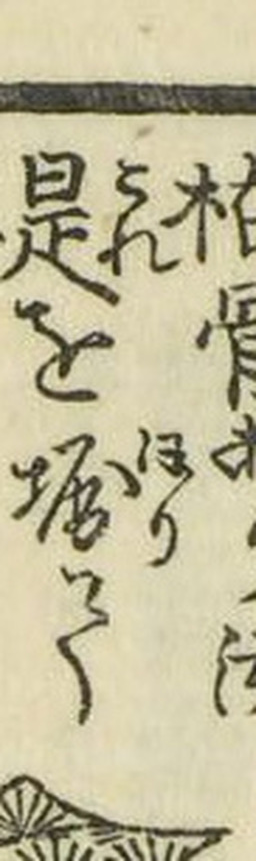是を堀て
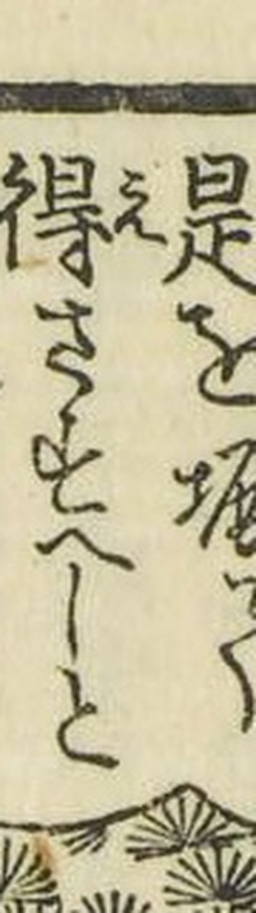得さすへしと
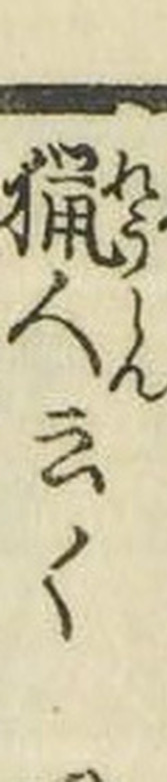猟人云く
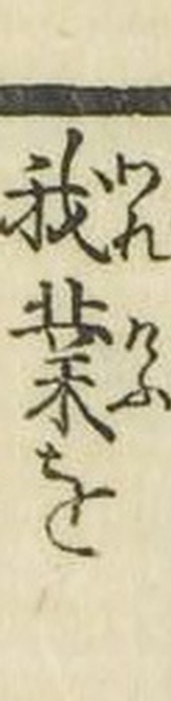我業を
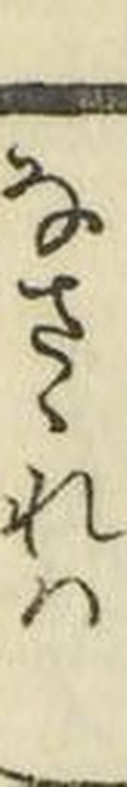なさゝれは
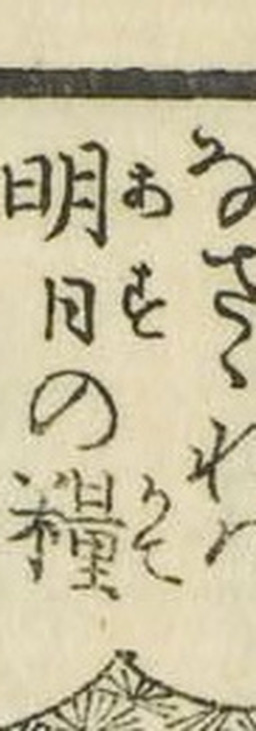明日の糧
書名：江戸名所図会 20巻 巻之16
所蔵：東京学芸大学教育コンテンツアーカイブ
